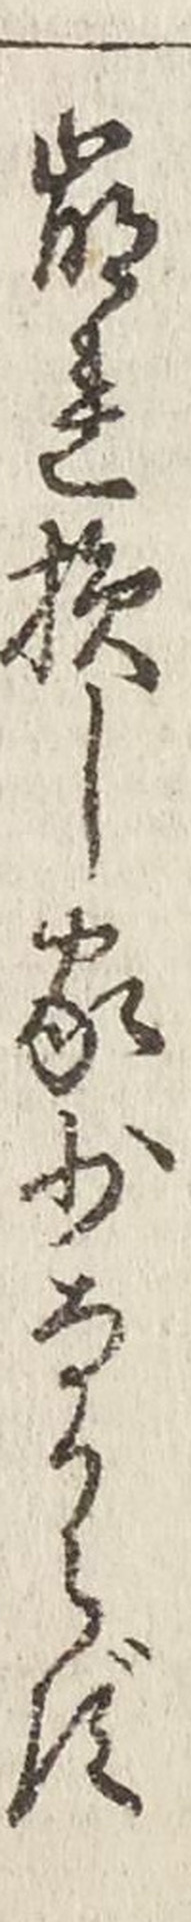崩れ損し家少なからず
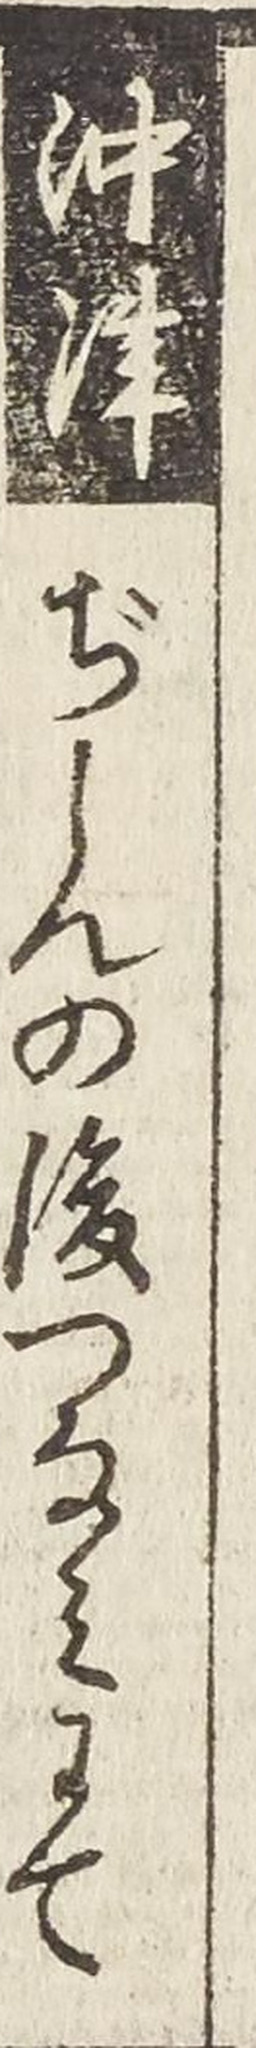沖津ぢしんの後つなみにて
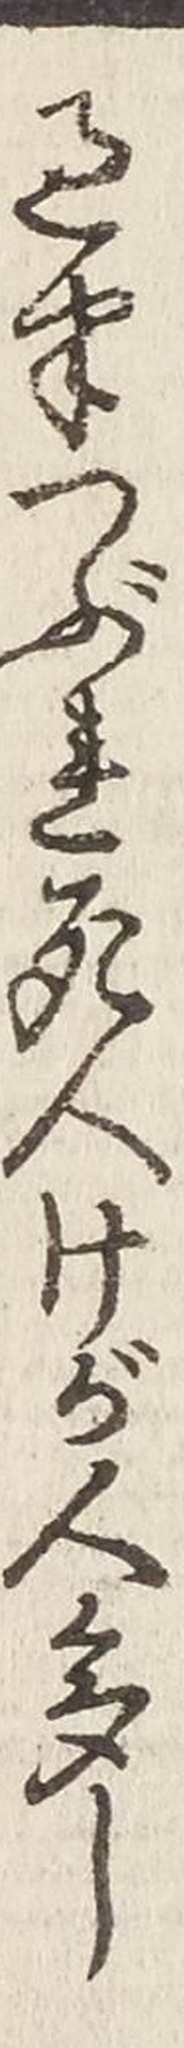過半つぶれ死人けが人多し
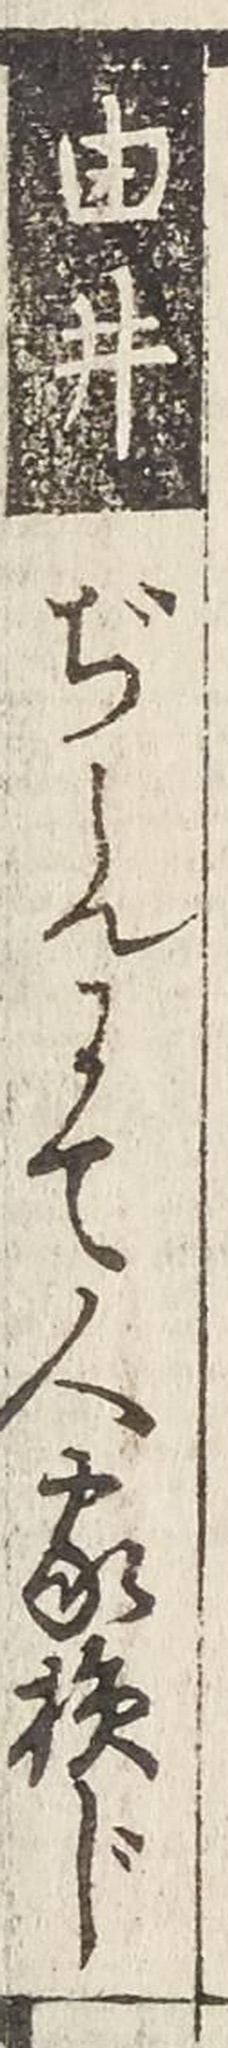由井ぢしんにて人家損じ
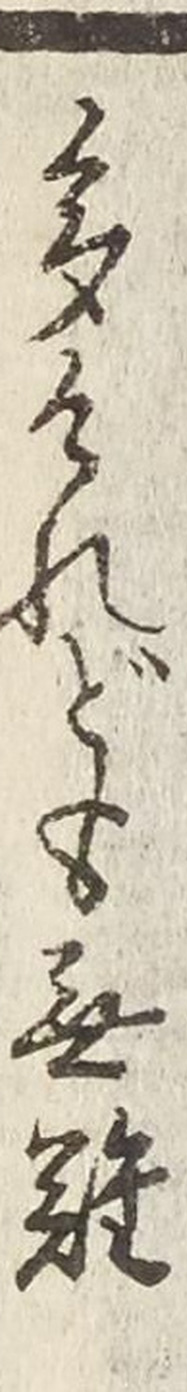多けれども無難
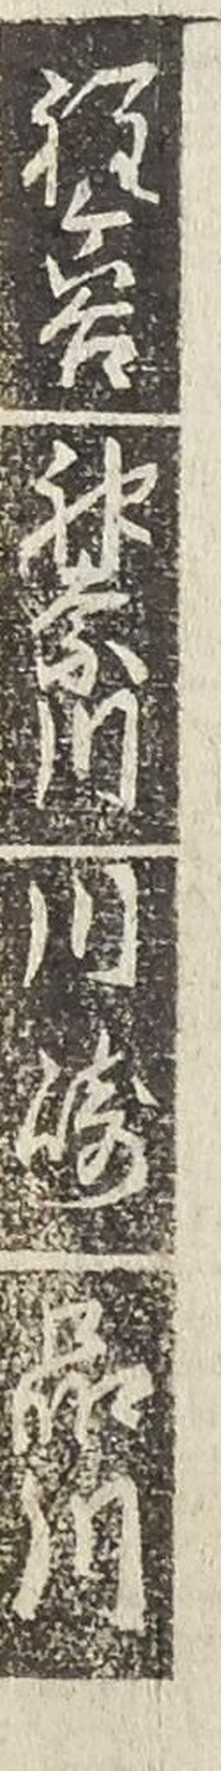程ヶ谷神奈川川﨑品川
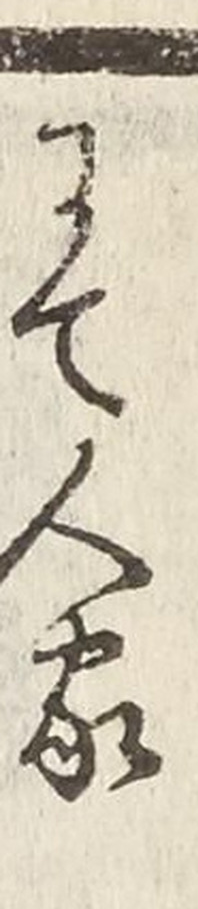にて人家
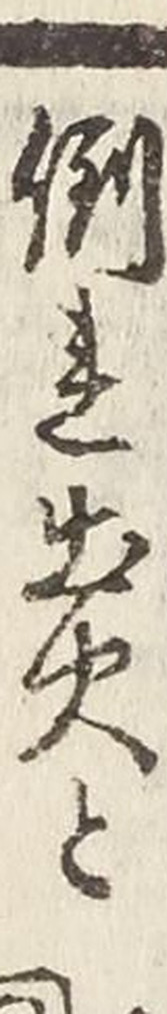倒れ出火と
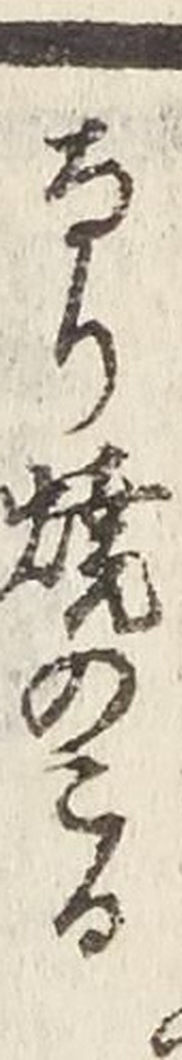なり焼のこる
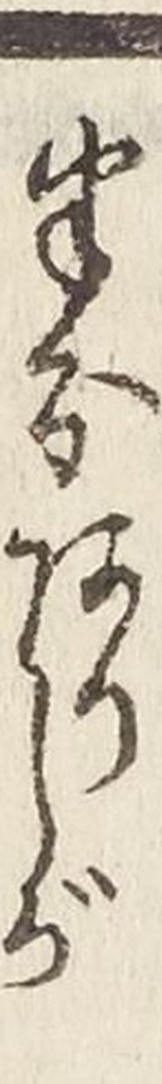半分ありしが
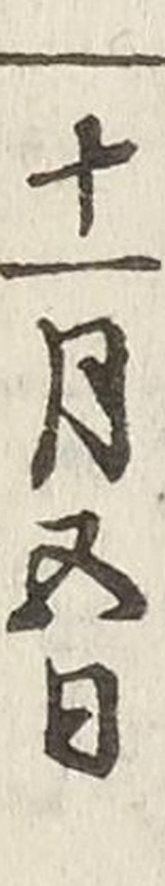十一月五日
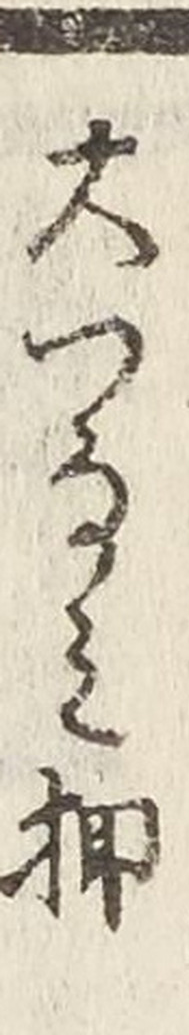大つなみ押
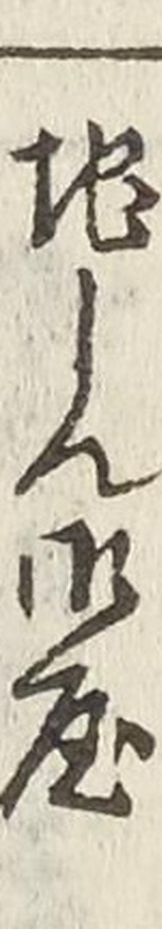地しん御屋
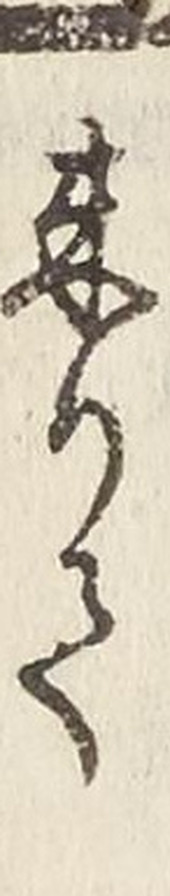来りて
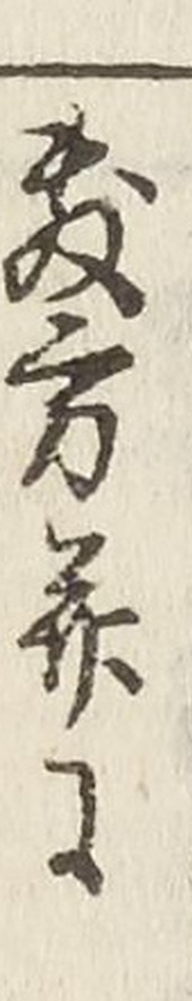敷方并に
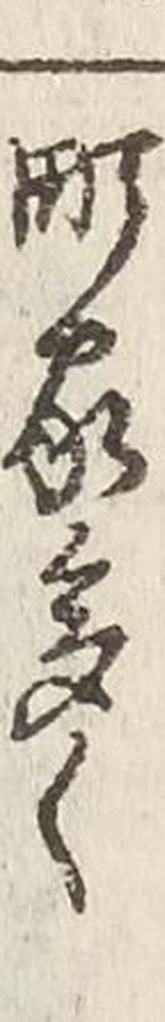町家多く
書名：大地震大津浪末代噺種　（二編　全）
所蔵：東京大学地震研究所図書室 Earthquake Research Institute Library, The University of Tokyo, JAPAN
